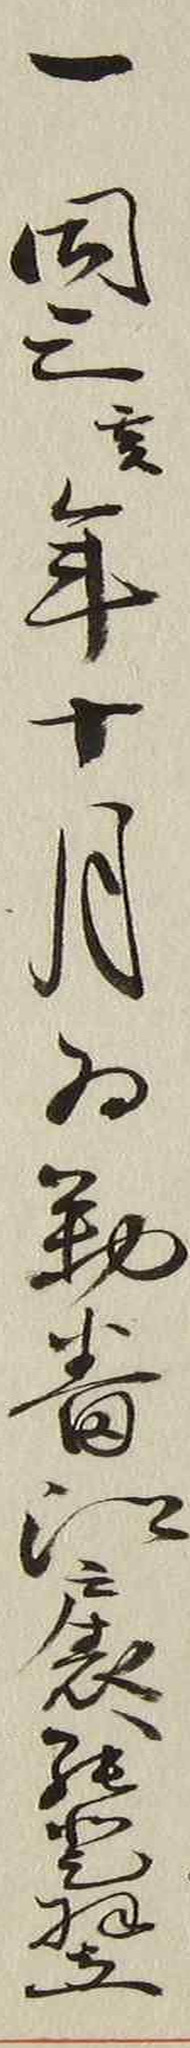一同三亥年十月為勤番江戸表ㇸ罷登翌
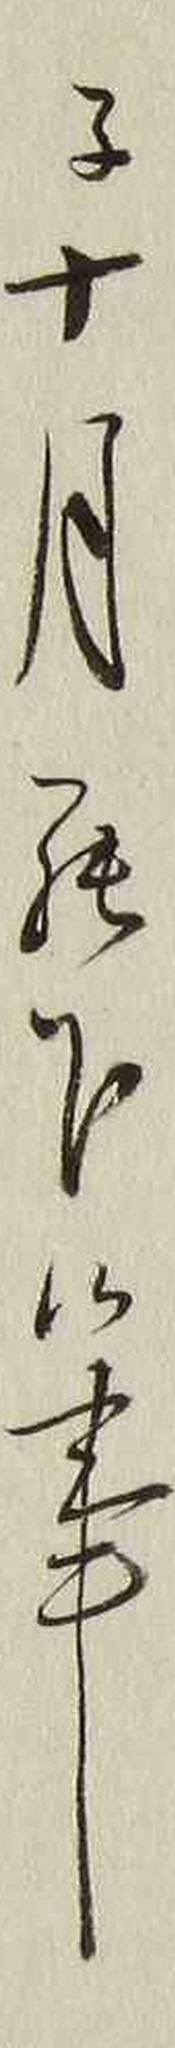子十月罷下候事
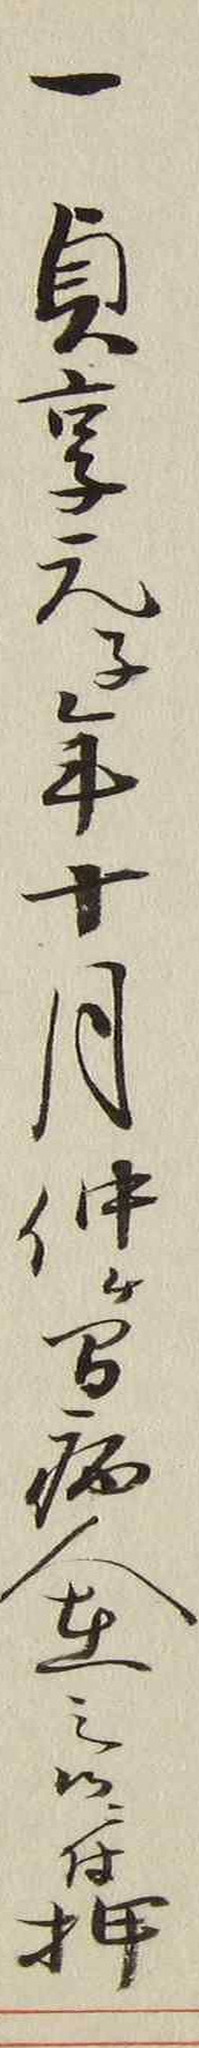一貞享元子年十月仲ヶ間病人在之候ニ付押
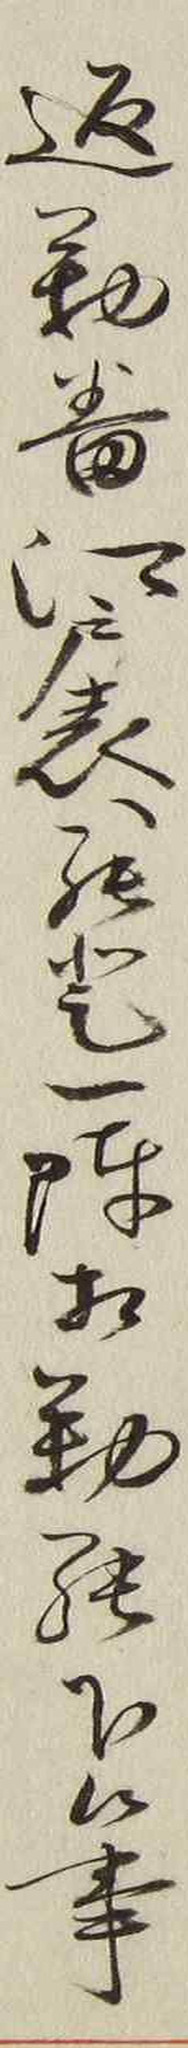返勤番江戸表ㇸ罷登一陣相勤罷下候事
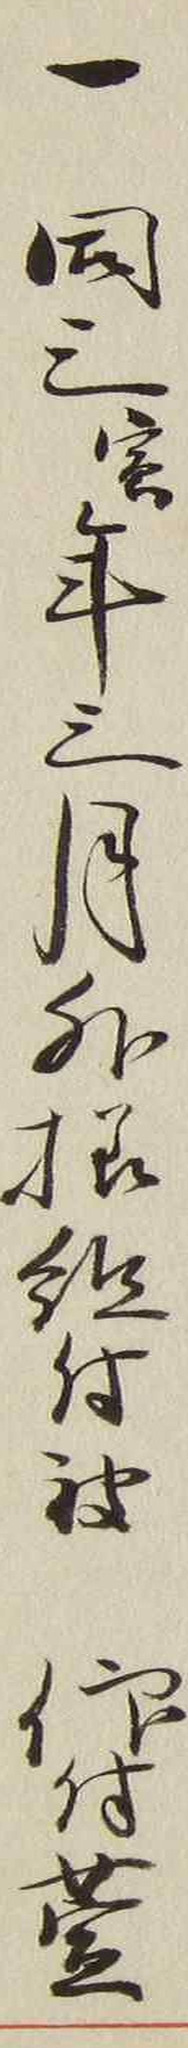一同三寅年三月外様組付被仰付萱

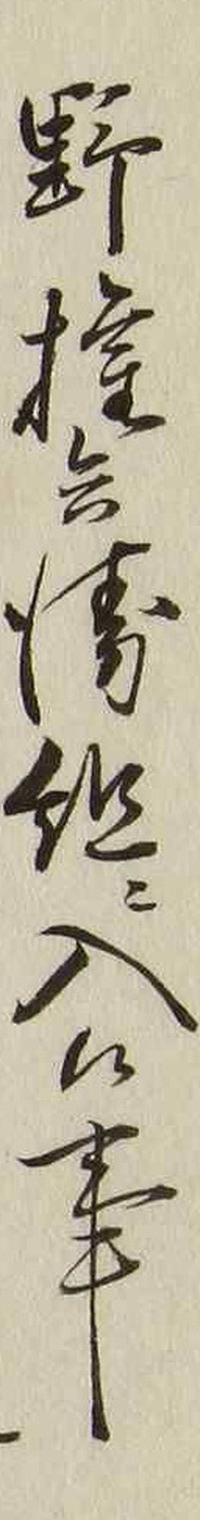野権兵衛組ニ入候事
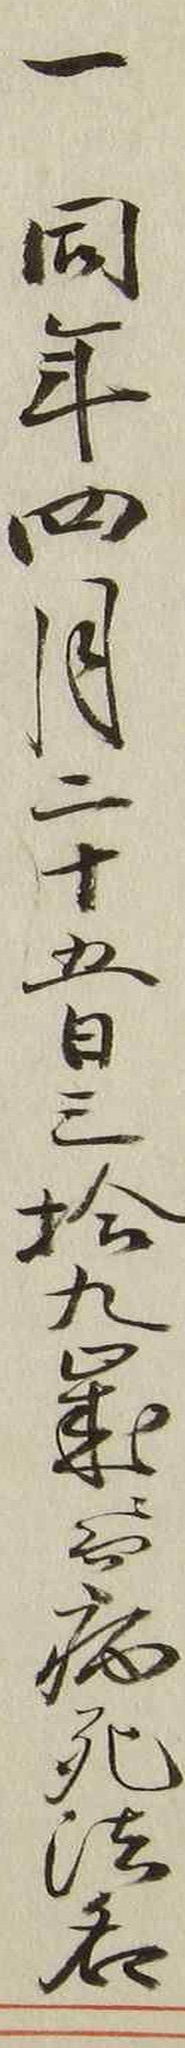一同年四月二十五日三拾九歳ニ而病死法名
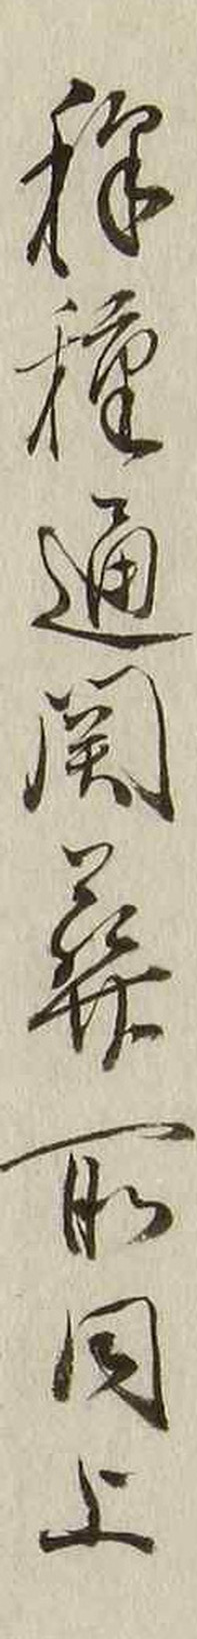釈種通関葬所同上
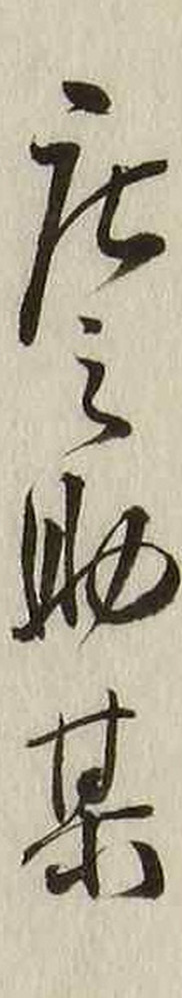庄之助某
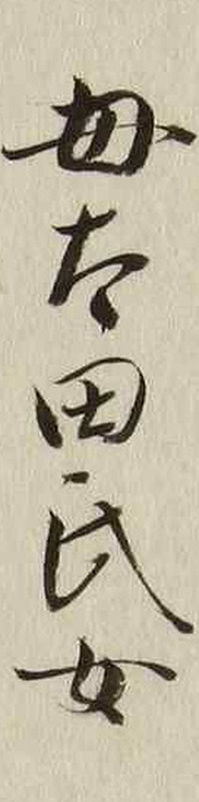母太田氏女
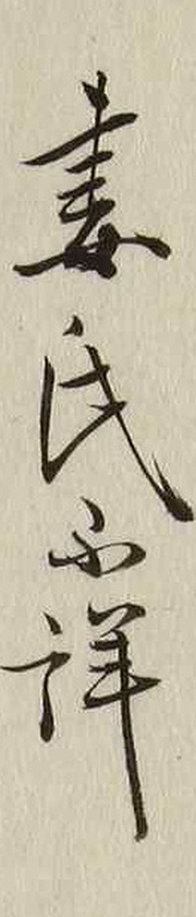妻氏不詳
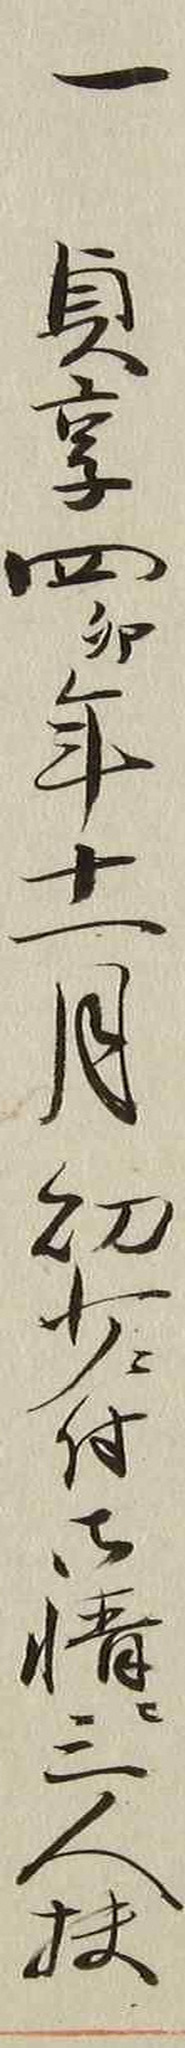一貞享四卯年十一月幼少ニ付御情ニ三人扶
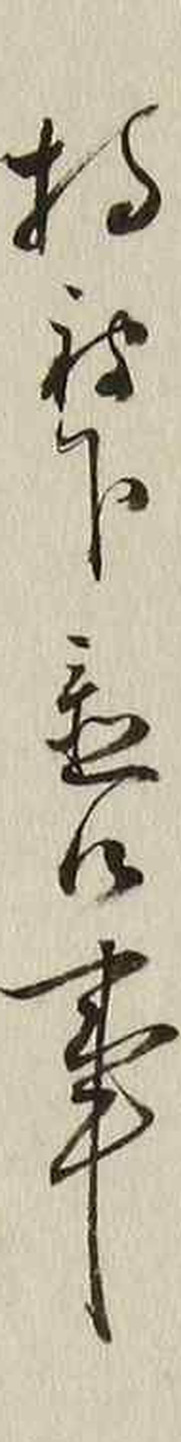持被下置候事
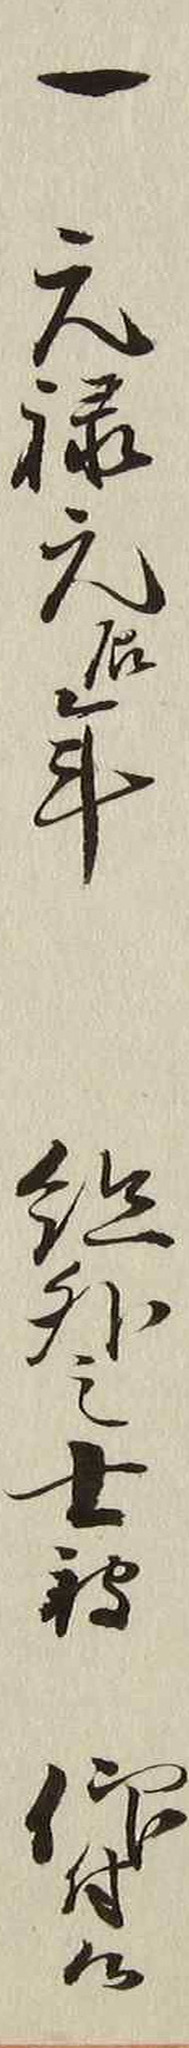一元禄元辰年組外之士被仰付候
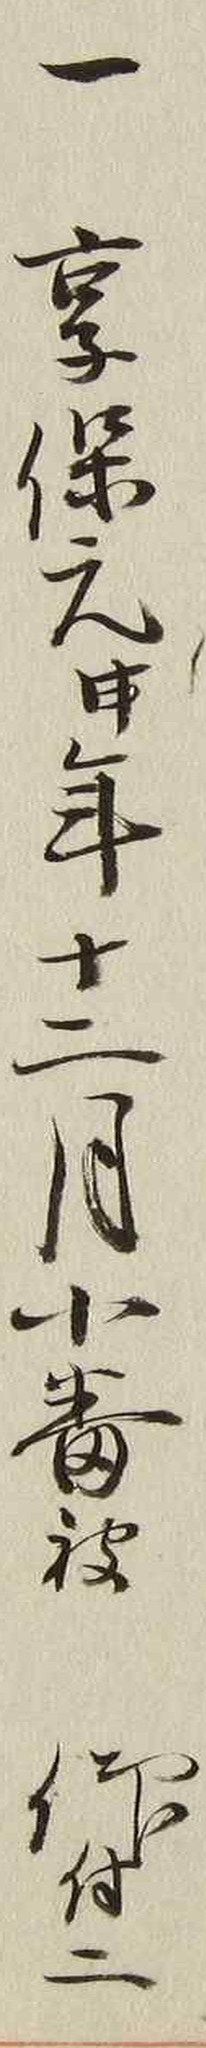一享保元申年十二月小番被仰付二
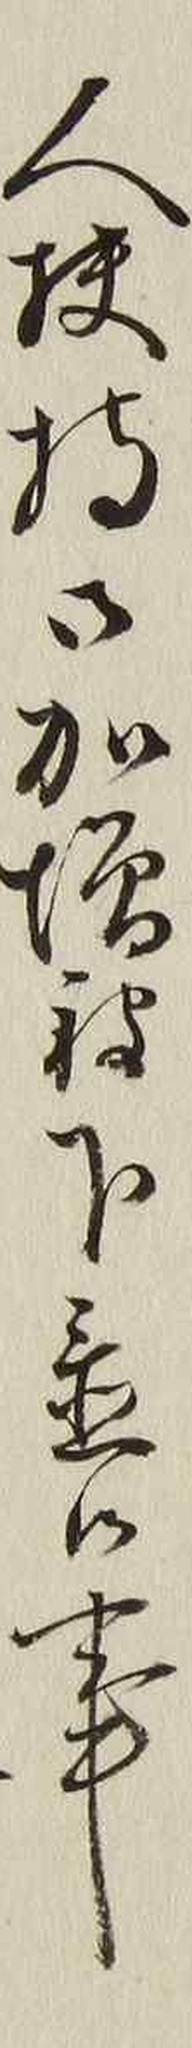人扶持御加増被下置候事
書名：諸士系譜　巻之163　な之部5
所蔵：会津若松市立会津図書館
